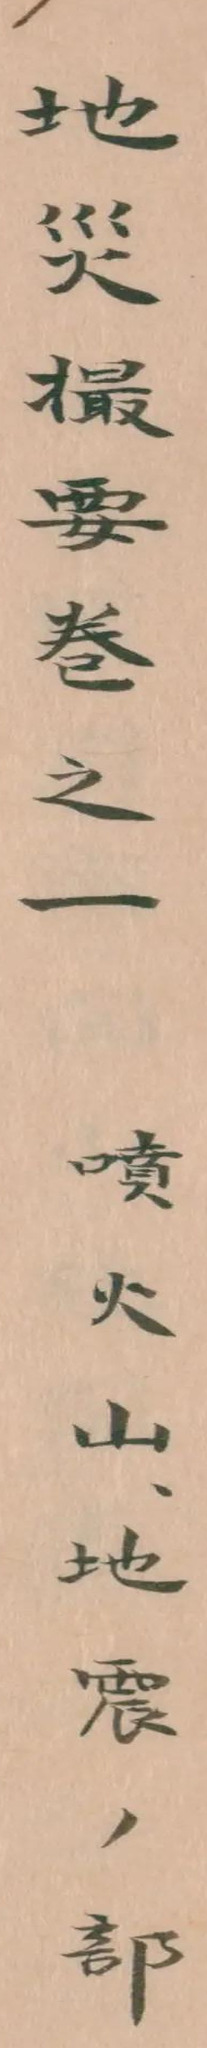地災撮要巻之一噴火山、地震ノ部
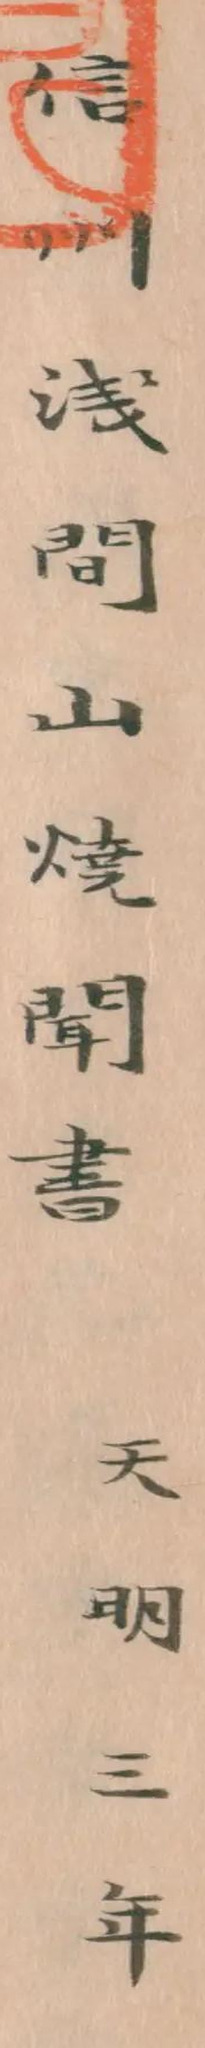信州浅間山焼聞書天明三年
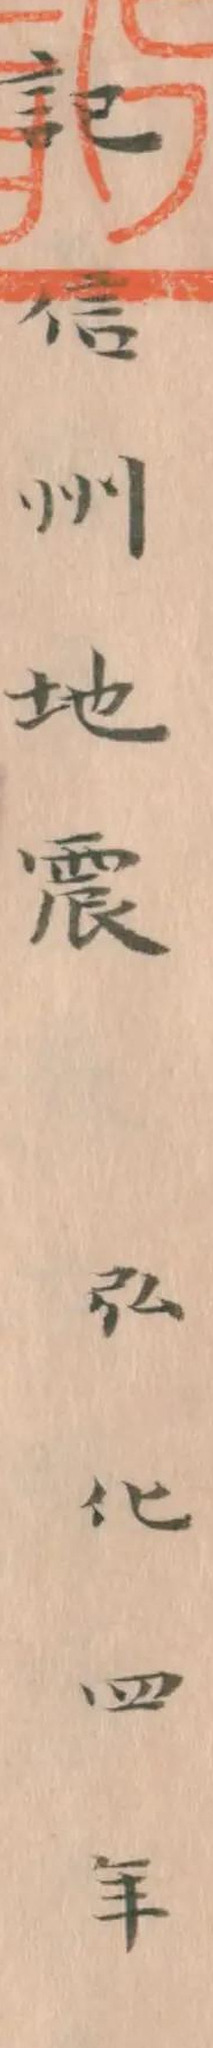記信州地震弘化四年
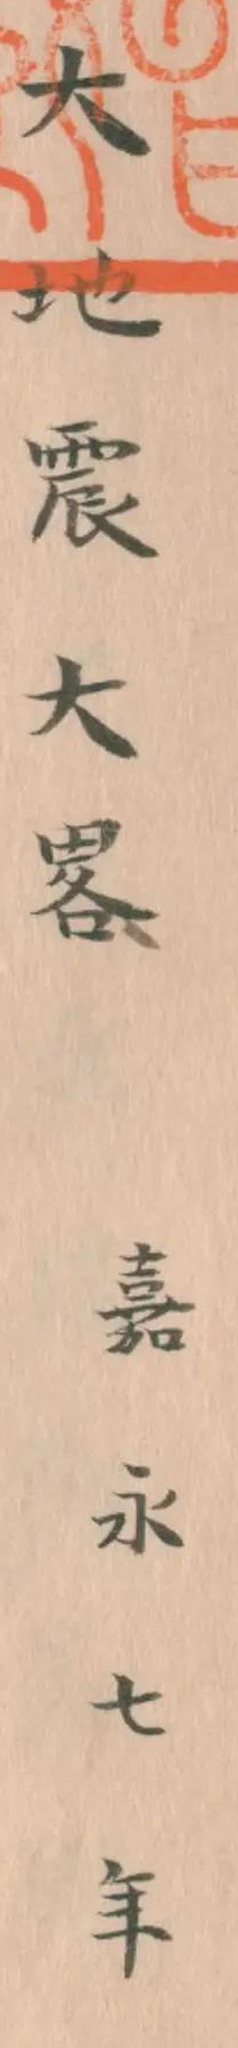大地震大略嘉永七年
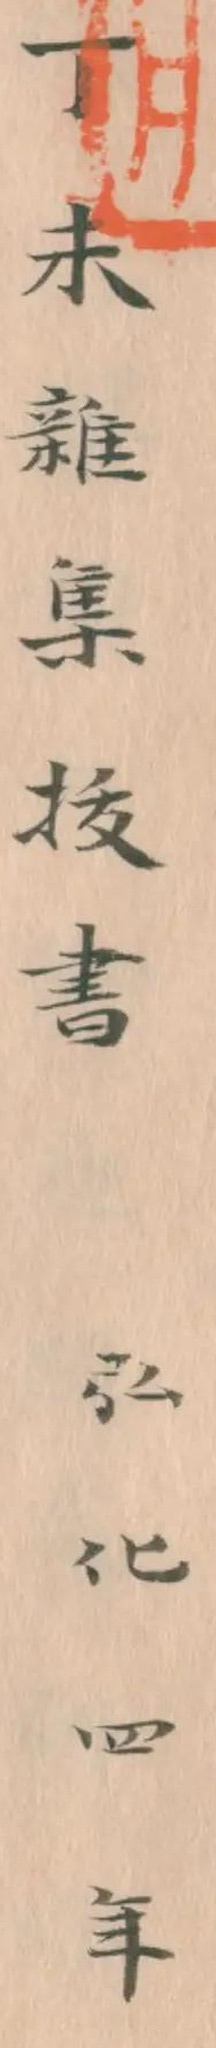丁未雑集抜書弘化四年
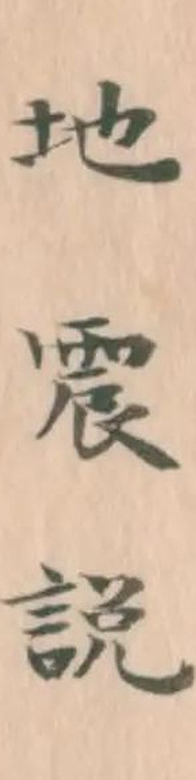地震説
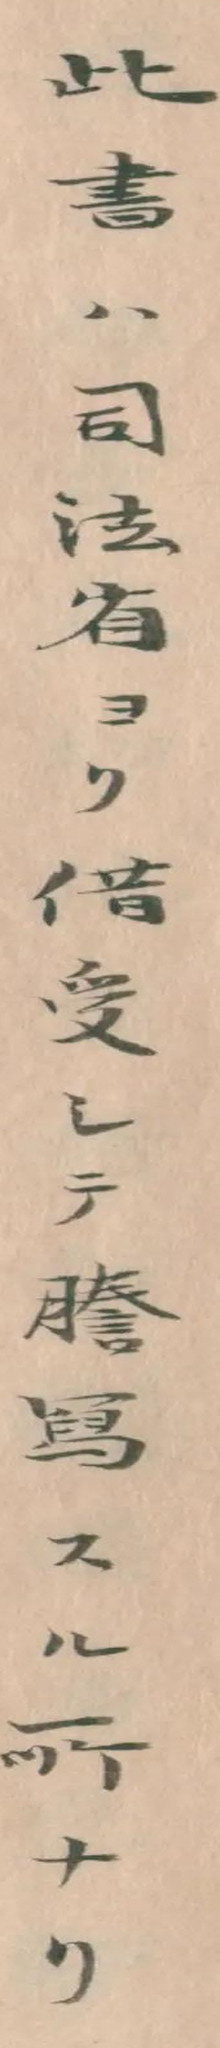此書ハ司法省ヨリ借受シテ謄写スル所ナリ

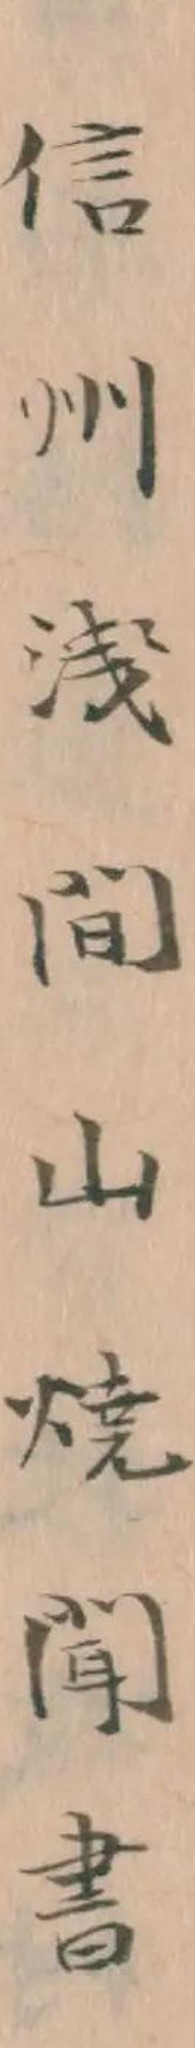信州浅間山焼聞書
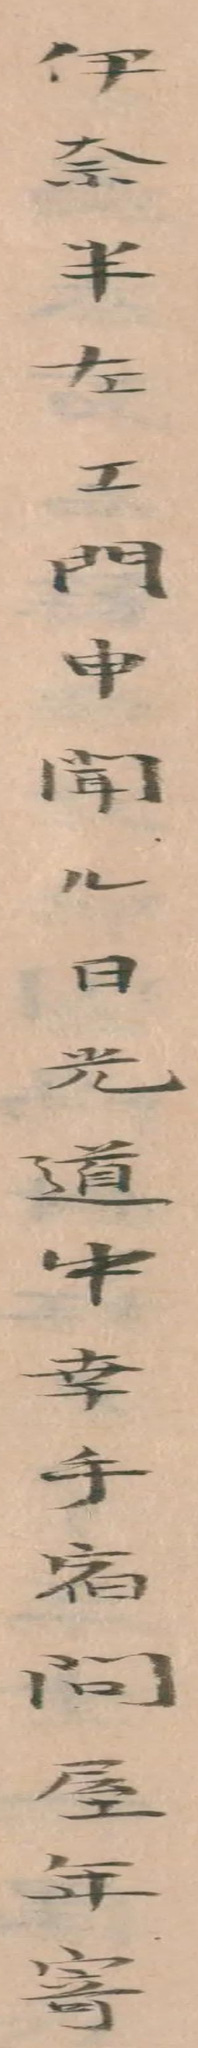伊奈半左衛門申聞ル日光道中幸手宿問屋年寄
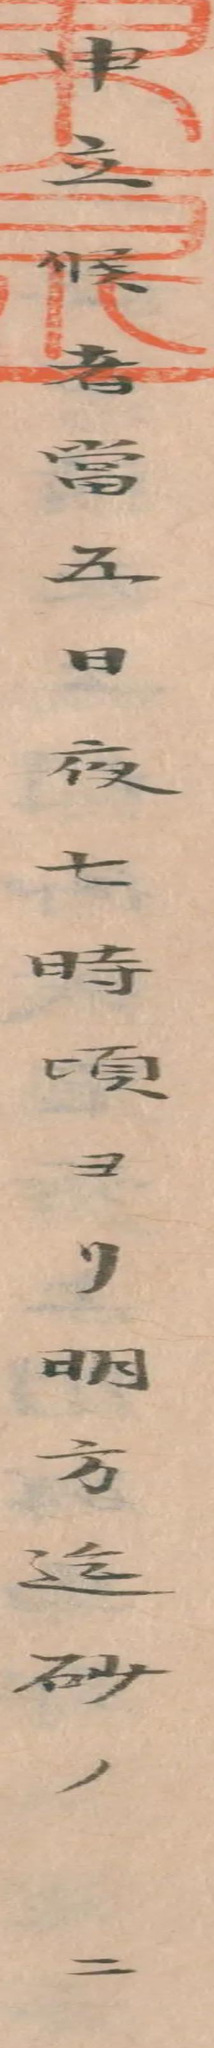申立候者当五日夜七時頃ヨリ明方迄砂ノ二
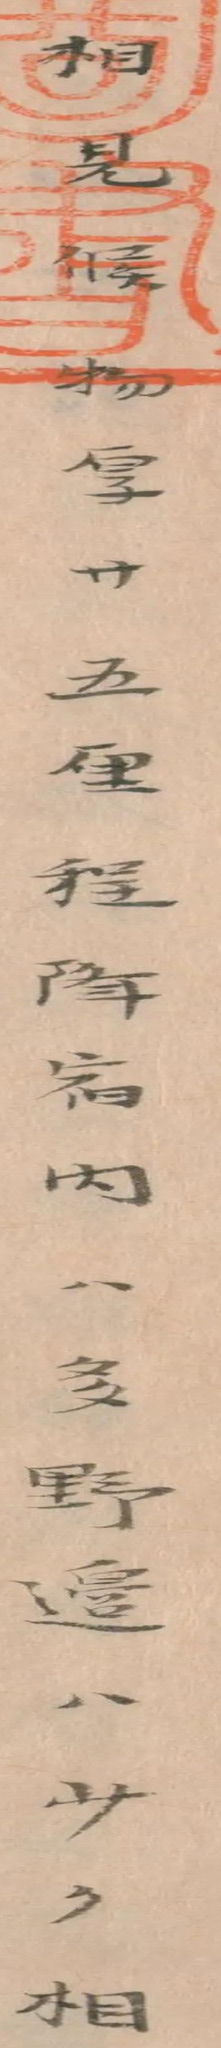相見候物厚サ五厘程降宿内ハ多野辺ハ少々相
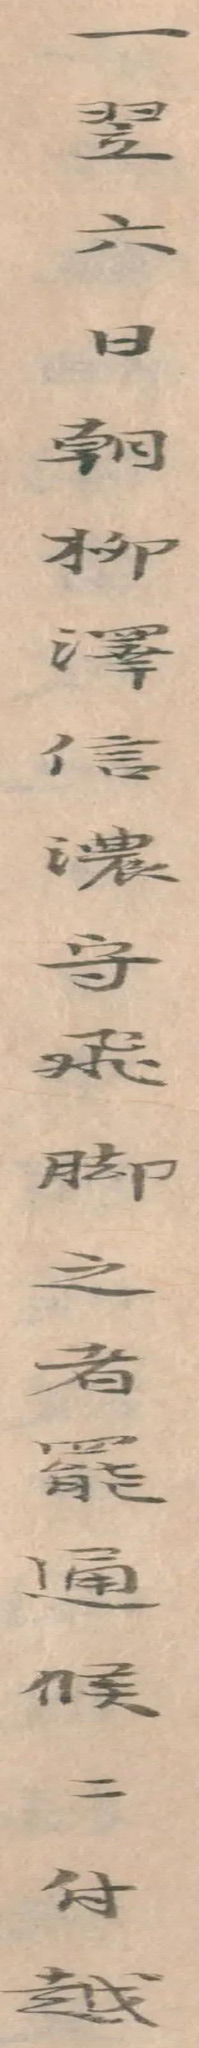一翌六日朝柳沢信濃守飛脚之者罷通工二付越
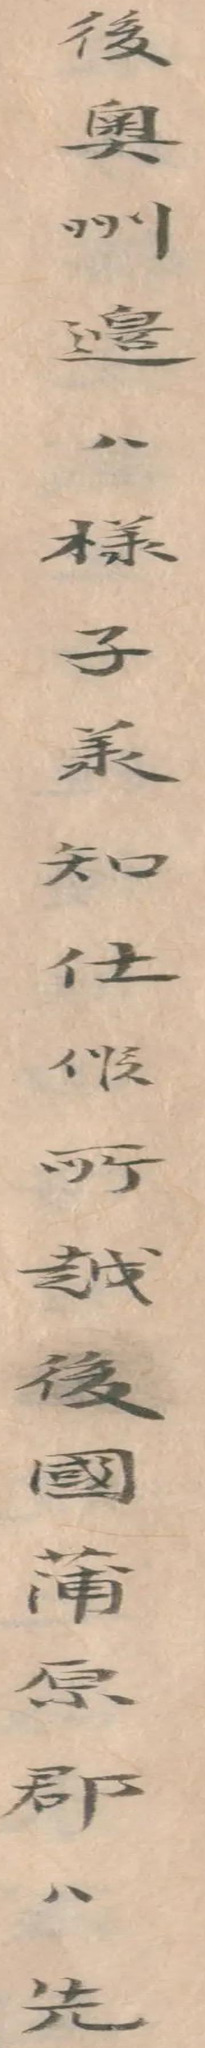後奥州辺ハ様子承知仕候所越後国蒲原郡ハ先
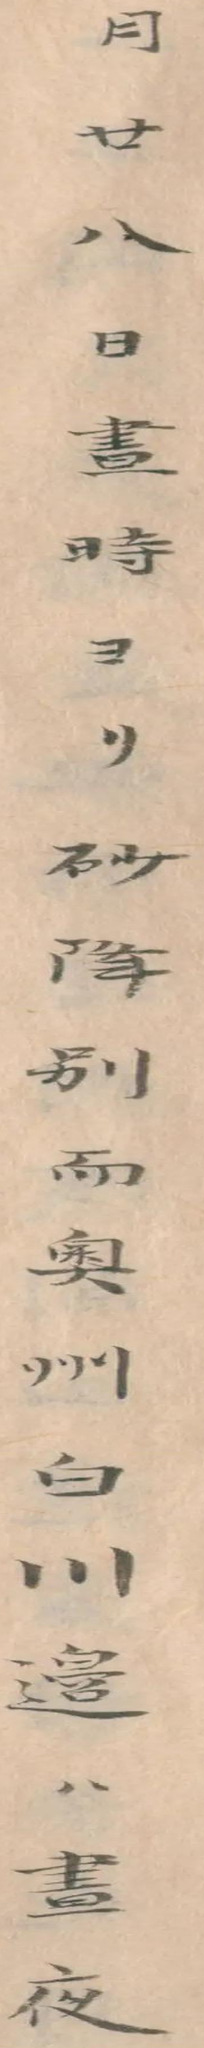月廿八日晝時ヨリ砂降別而奥州白川辺ハ晝夜
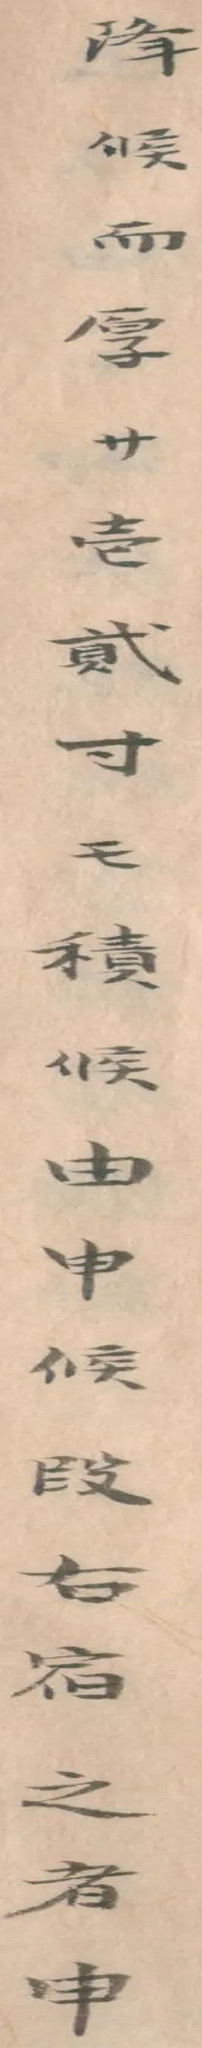降候而厚サ壱弐寸二積候由申候段右宿之者申

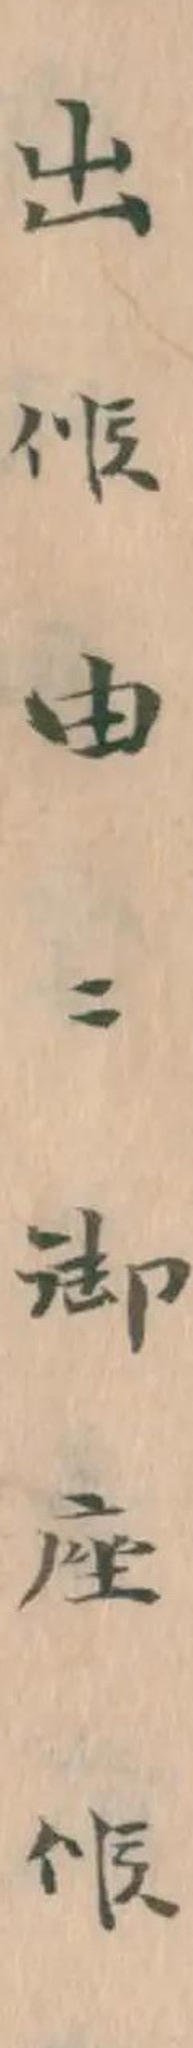出候由二御座候
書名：地災撮要. 巻1(噴火山・地震ノ部)
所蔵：国立国会図書館 National Diet Library, JAPAN
